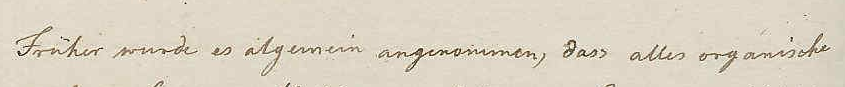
Früher wurde es algemein angenommen, dass alles organische
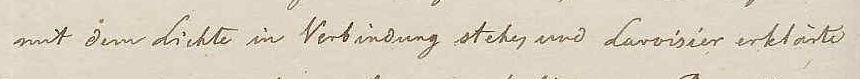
mit dem Lichte in Verbindung stehe, und Lavoisier erklärte
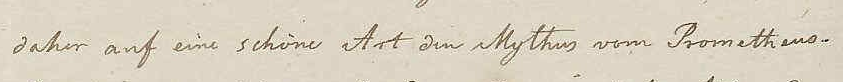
daher auf eine schöne Art den Mythus vom Prometheus.
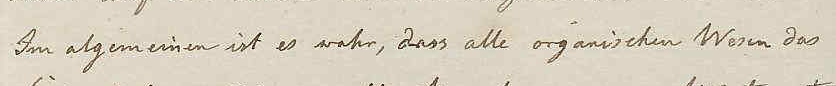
Im algemeinen ist es wahr, dass alle organischen Wesen das
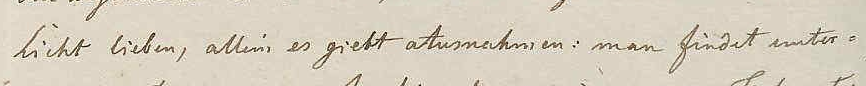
Licht lieben, allein es giebt Ausnahmen: man findet unter-
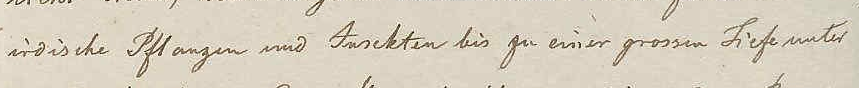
irdische Pflanzen und Insekten bis zu einer grossen Tiefe unter
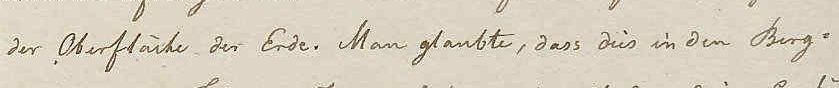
der Oberfläche der Erde. Man glaubte, dass dies in den Berg-
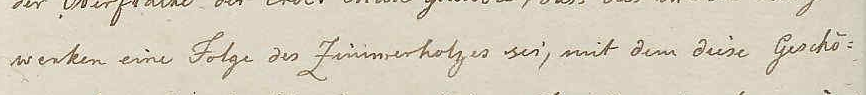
werken eine Folge des Zimmerholzes sei, mit dem diese Geschö-
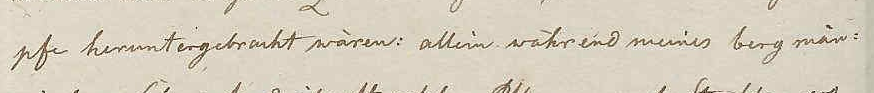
pfe heruntergebracht wären: allein während meines bergmän-
